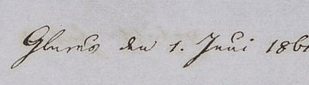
Glarus den 1. Juni 1861.
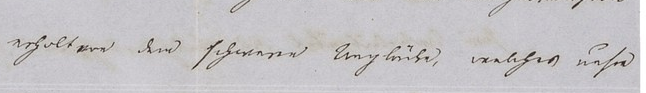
erholt von dem schweren Unglücke, welches unsre
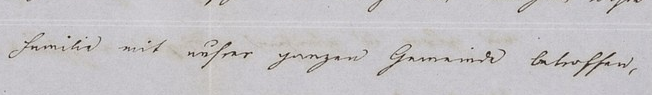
Familie mit unsrer ganzen Gemeinde betroffen,
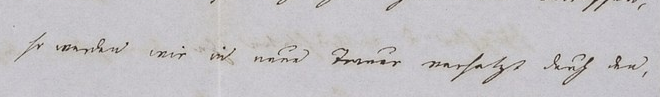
so werden wir in neue Trauer versetzt durch den,
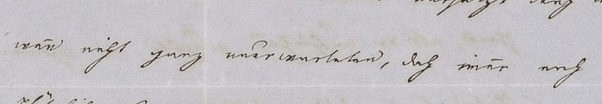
wenn nicht ganz unerwarteten, doch immer noch
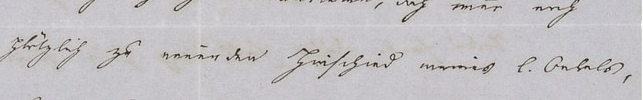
plötzlich zu nennenden Hinschied meines l. Onkels,
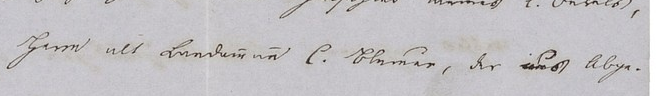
Herrn alt Landammann C. Blumer, der uns Abge-
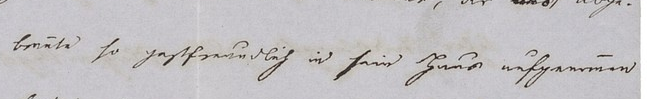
brannte so gastfreundlich in sein Haus aufgenommen
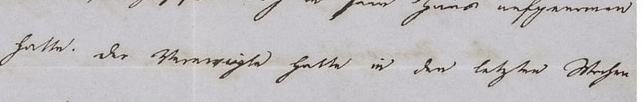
hatte. Der Verewigte hatte in den letzten Wochen
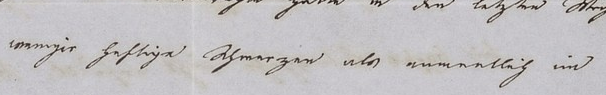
weniger heftige Schmerzen als namentlich im
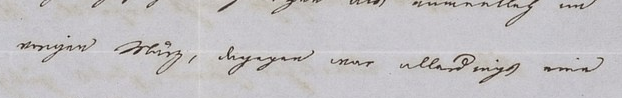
vorigen März, dagegen war allerdings eine
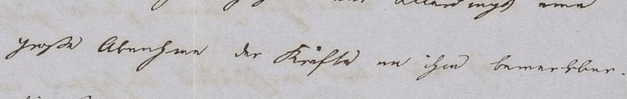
große Abnahme der Kräfte an ihm bemerkbar.
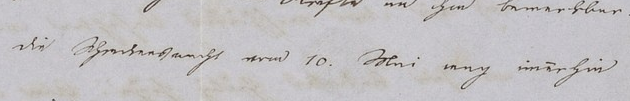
Die Schreckensnacht vom 10. Mai mag immerhin
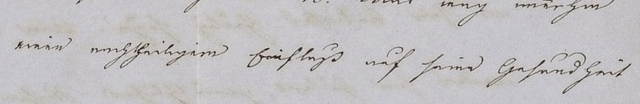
einen nachtheiligern Einfluß auf seine Gesundheit
